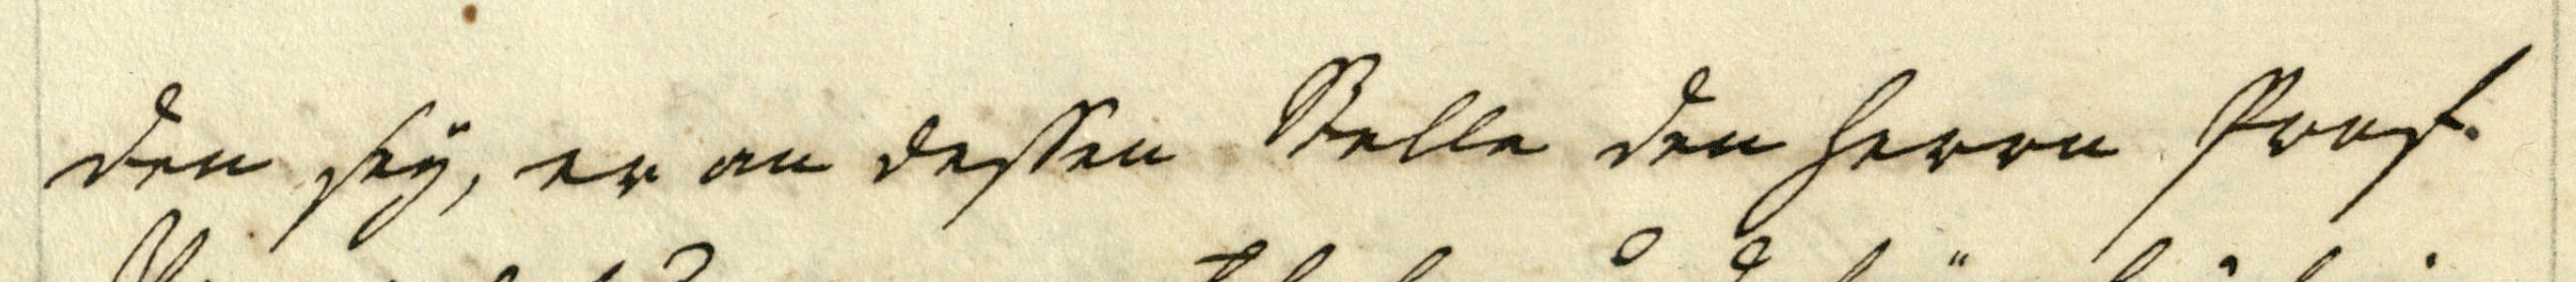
den seÿ, er an dessen Stelle den Herrn Prof.
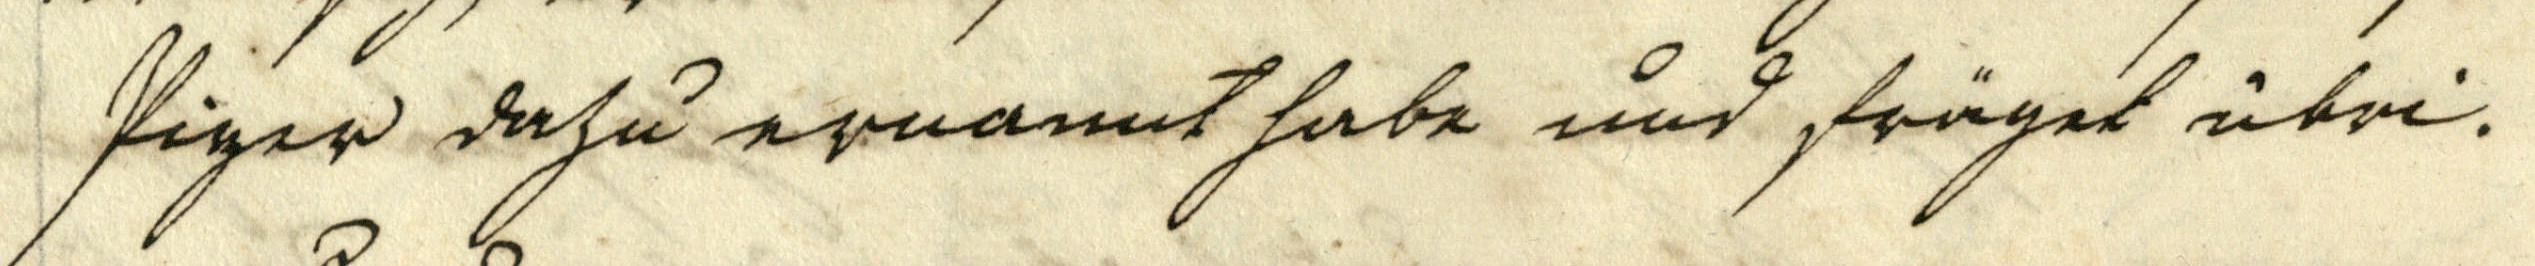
Piper dazu ernannt habe und fräget übri¬
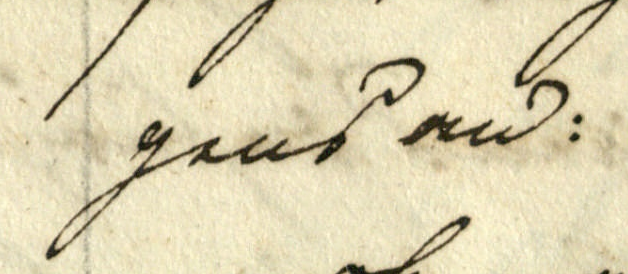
gens an:
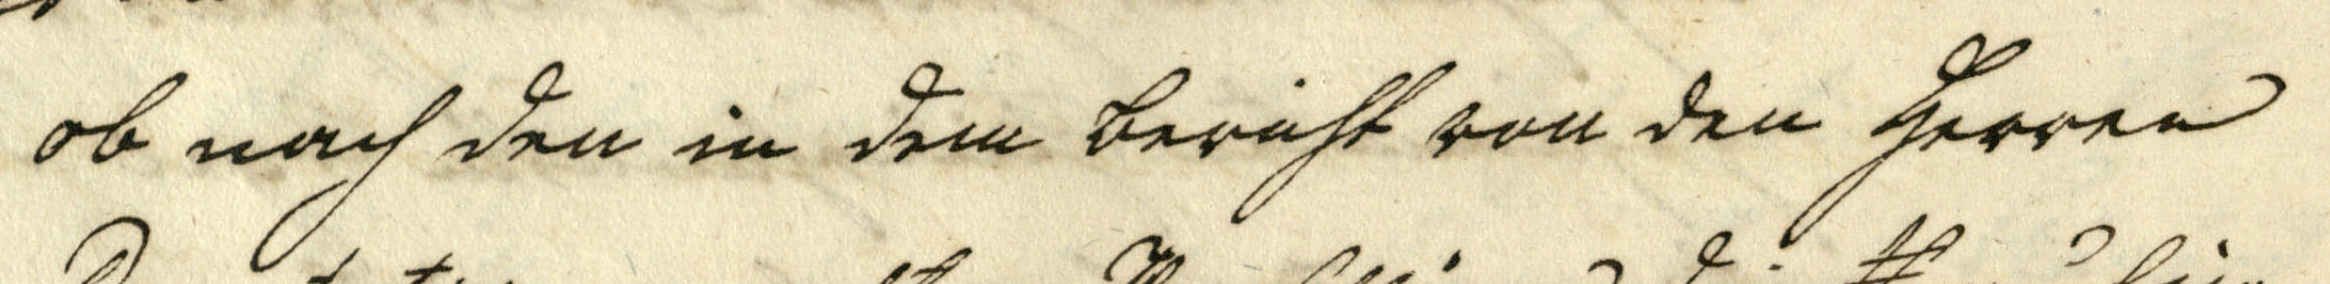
ob nach den in dem Bericht von den Herren
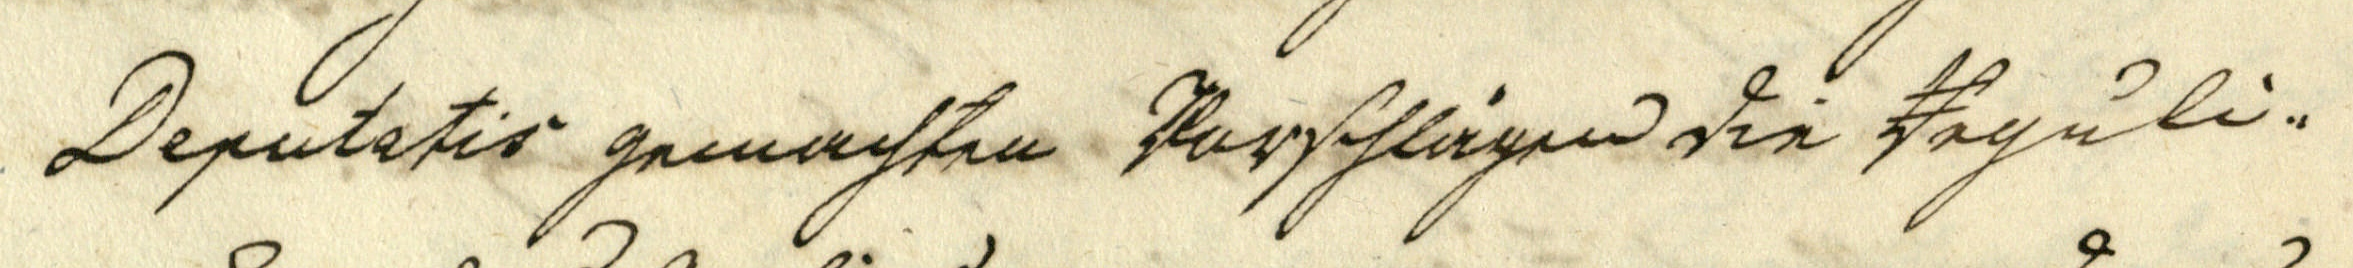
Deputatis gemachten Vorschlägen die Reguli¬
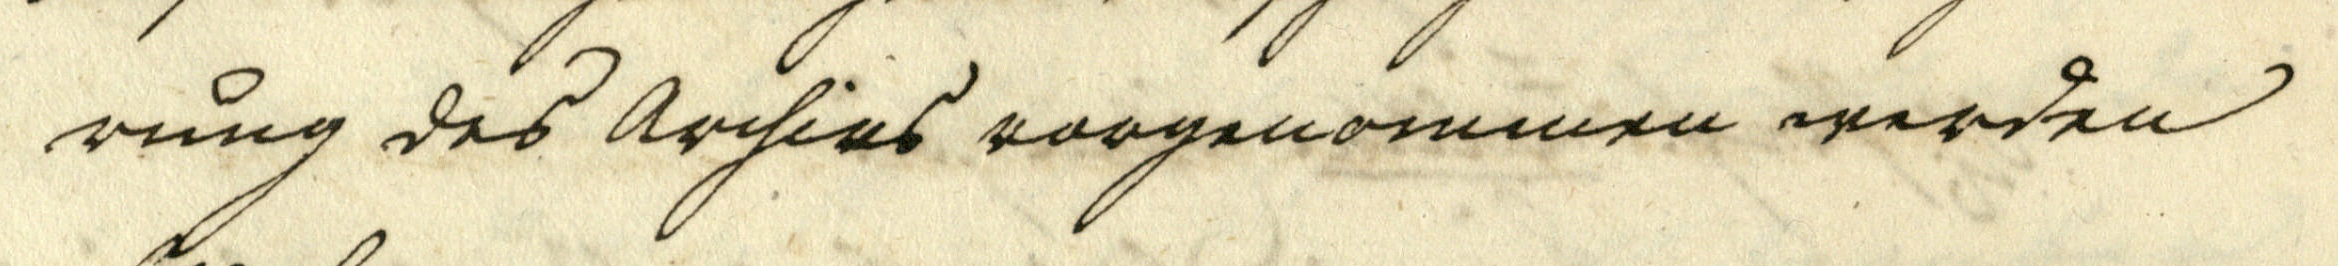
rung des Archivs vorgenommen werden
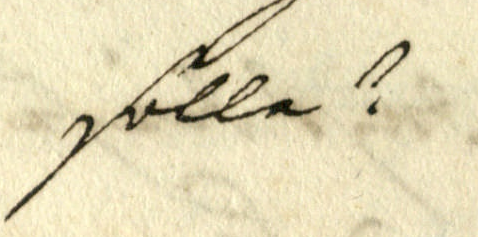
solle?
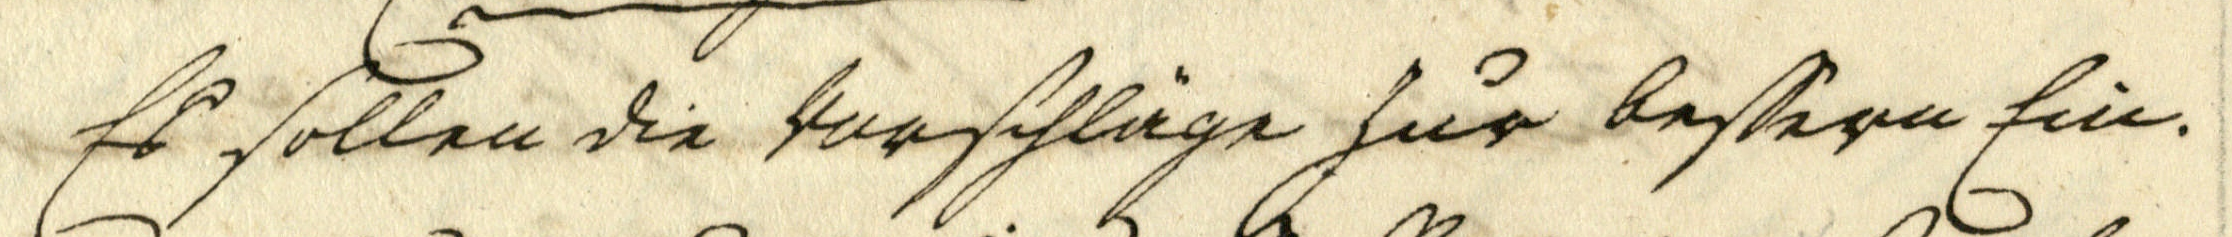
Es sollen die Vorschläge zur bessern Ein-
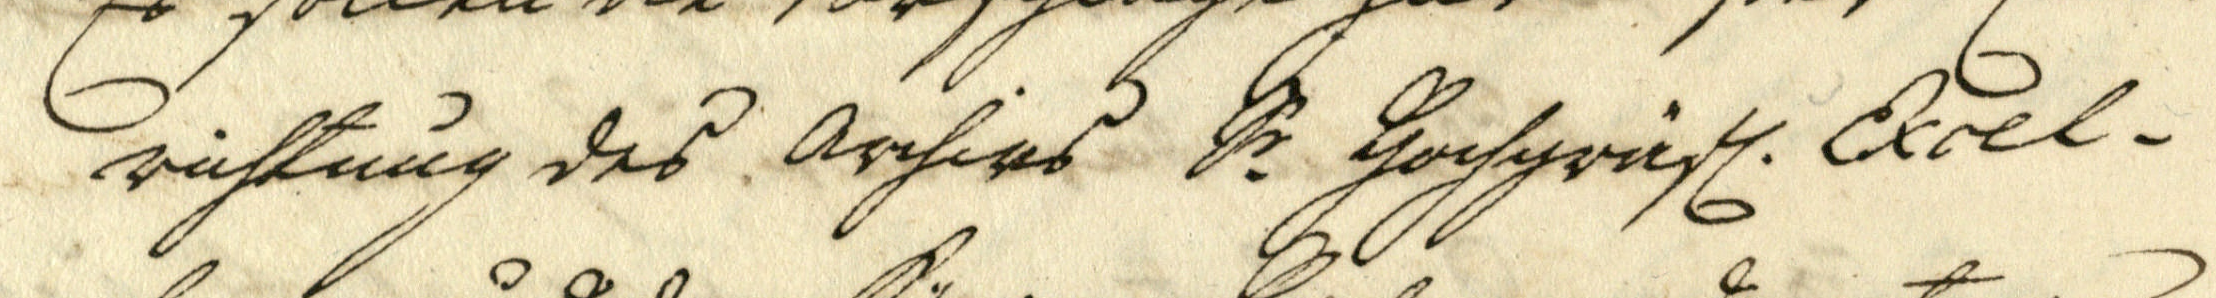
richteung des Archivs Sr. Hochgräfl. Excel¬
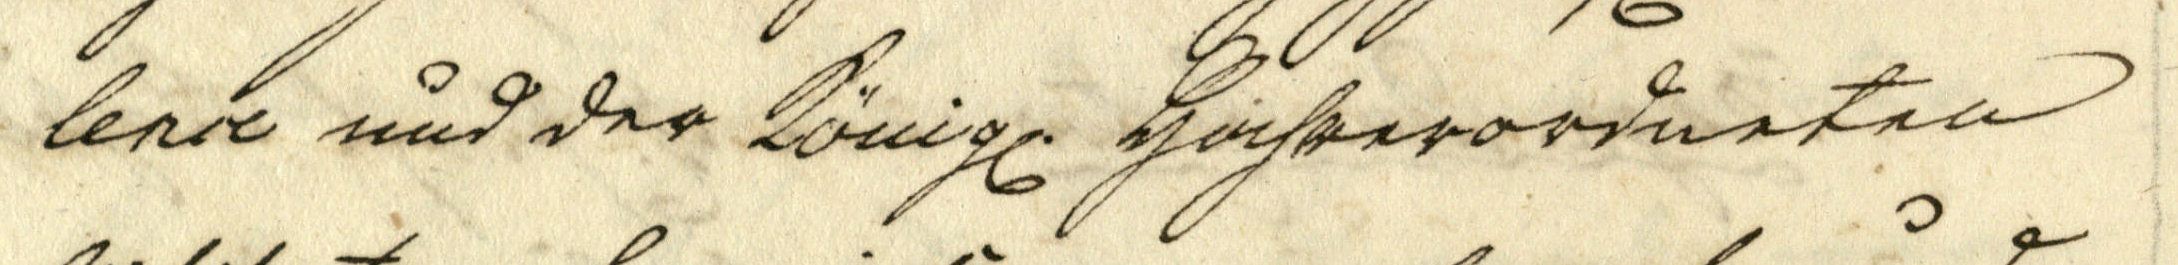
lence und der Königl. Hochverordneten
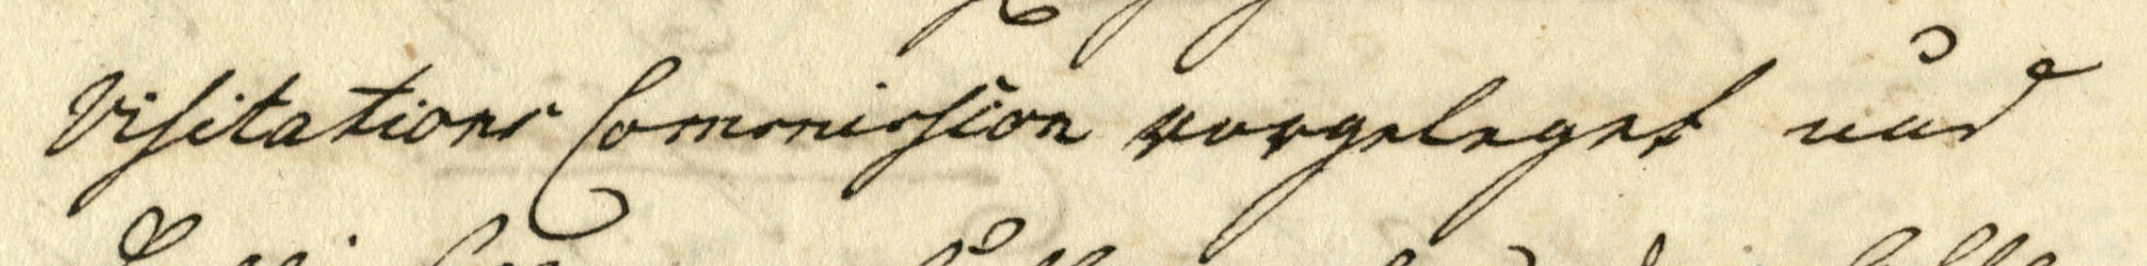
Visitations Commission vorgeleget und
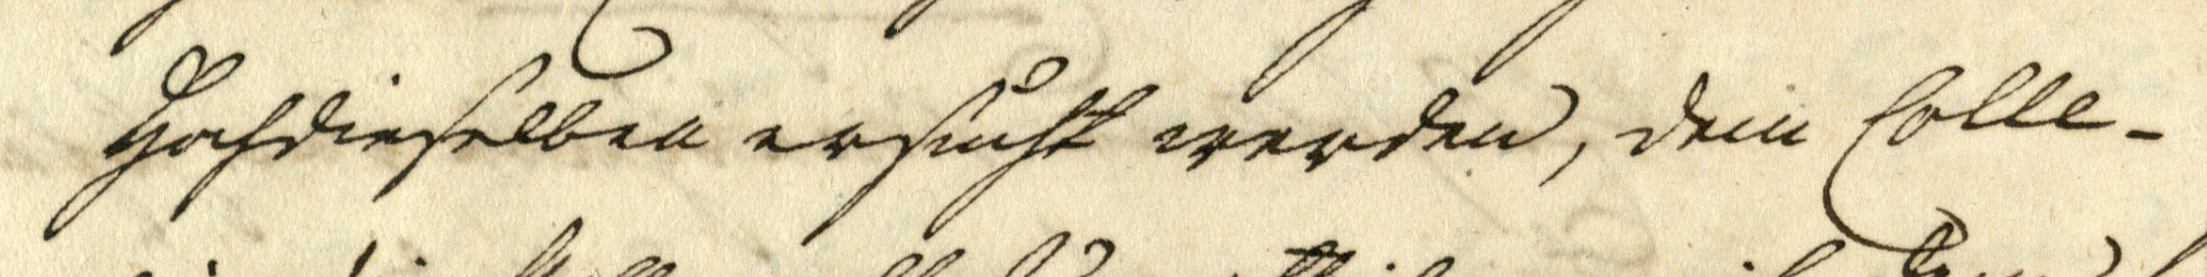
Hochdieselben ersucht werden, dem Colle¬
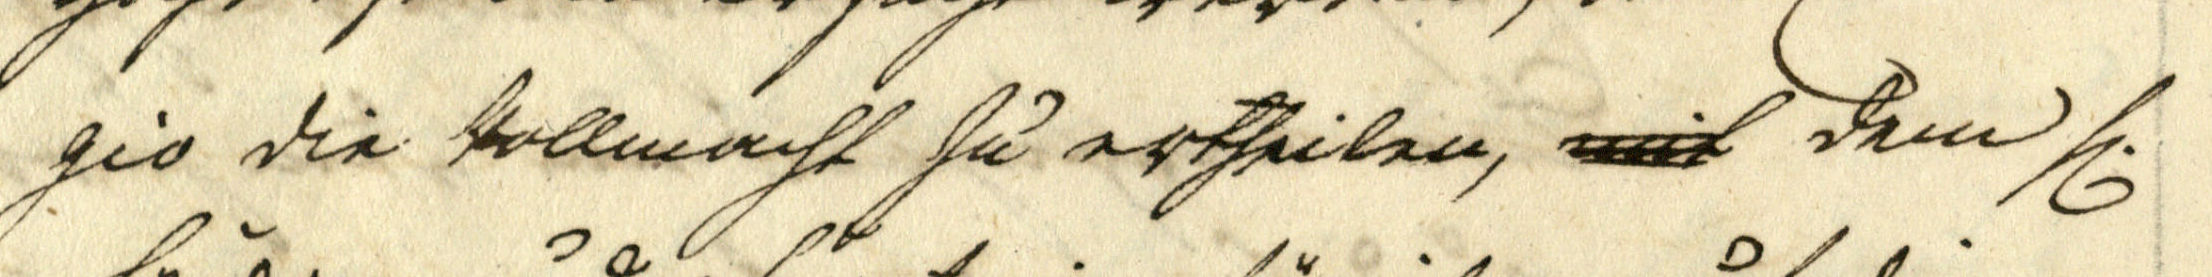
gio die Vollmacht zu ertheilen, es mit dem H.
